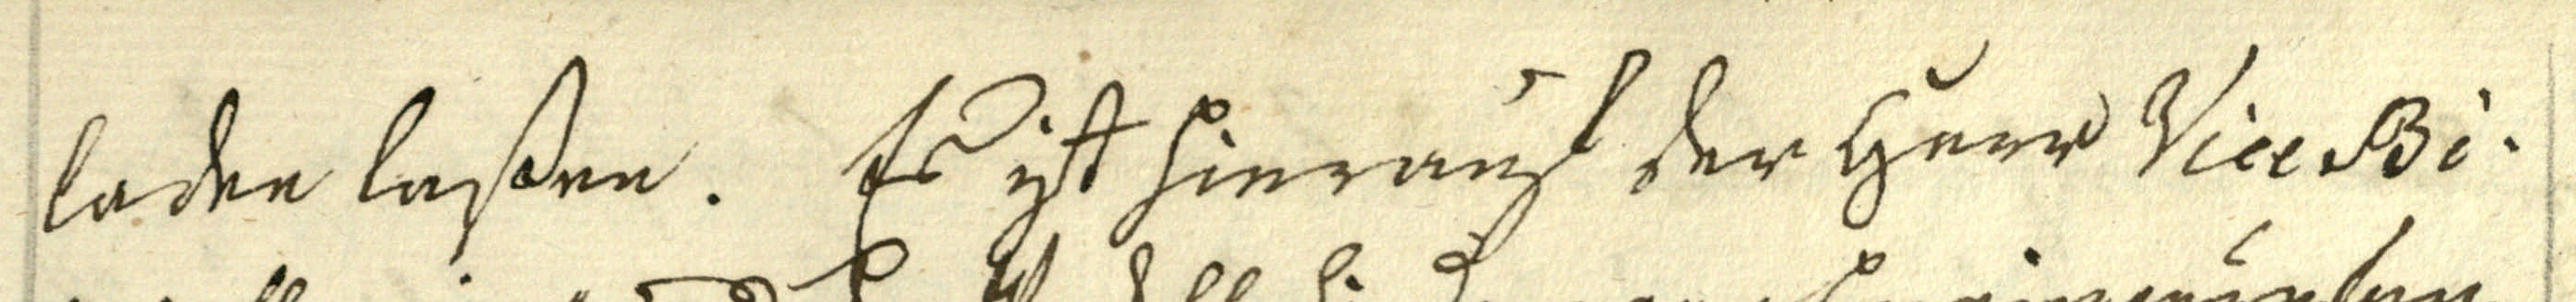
laden laßen. Es ist hierauf der Herr Vice Bi¬
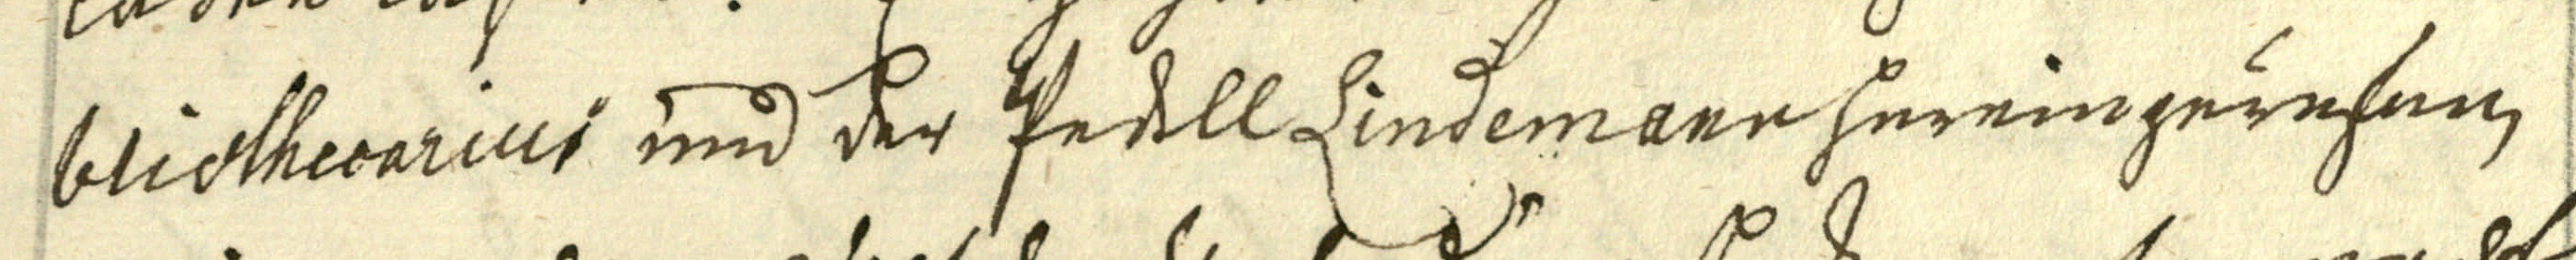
bliothecarius und der Pedell Lindemann hereingerufen,
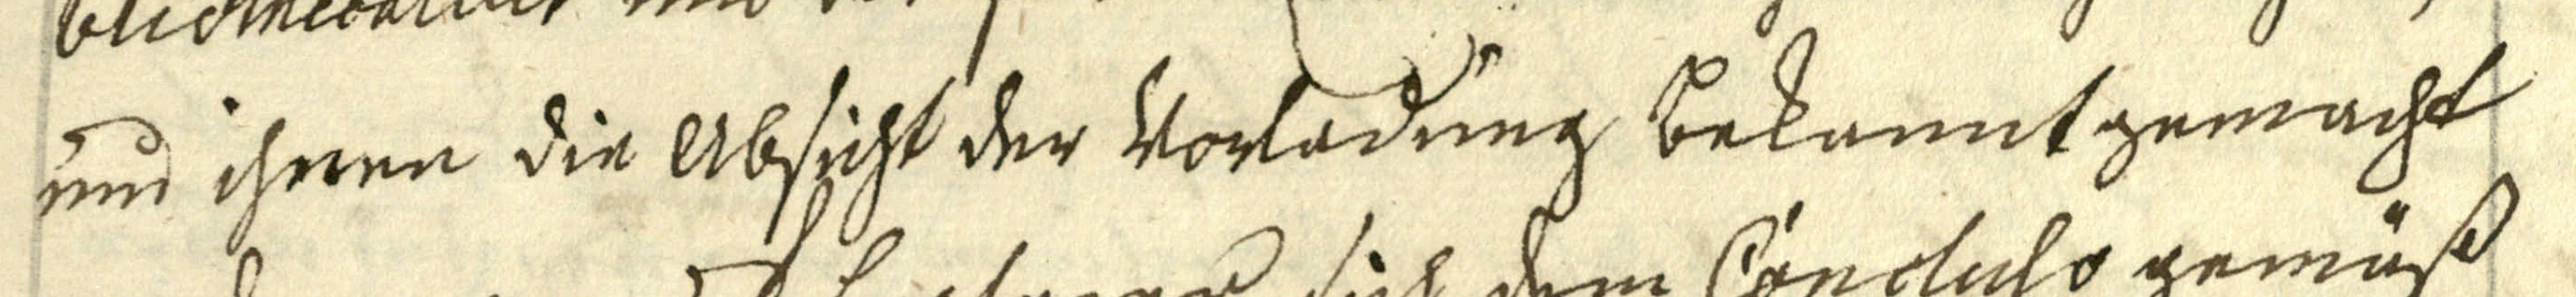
und ihnen die Absicht der Vorladung bekannt gemacht
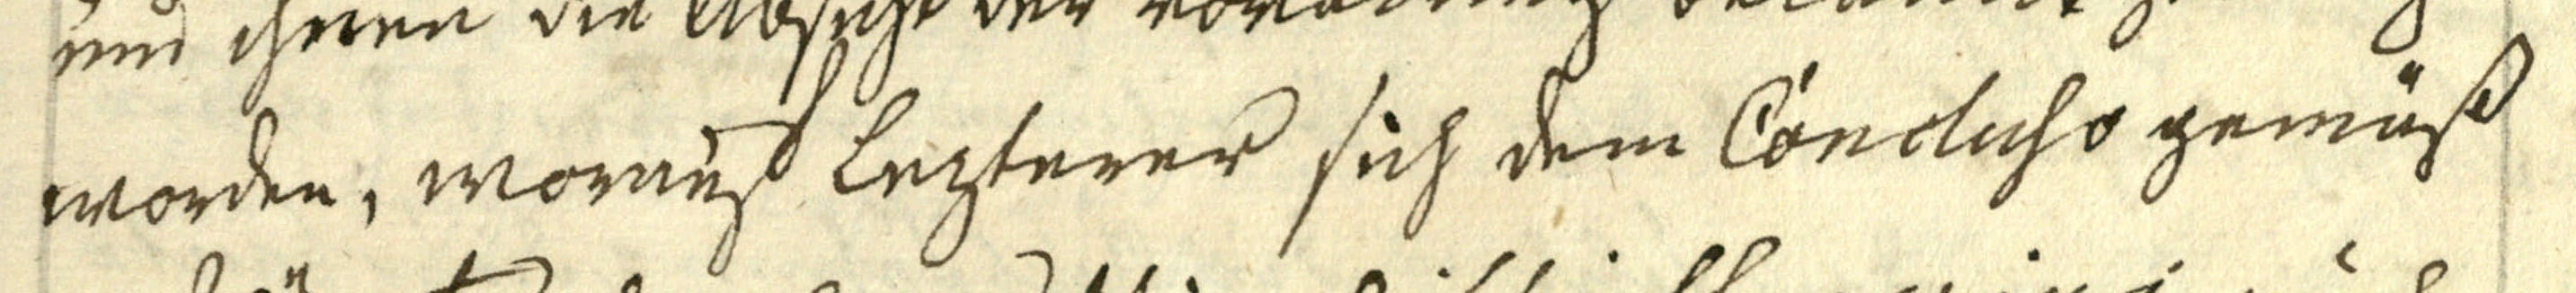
worden, worauf Lezterer sich dem Concluso gemäß
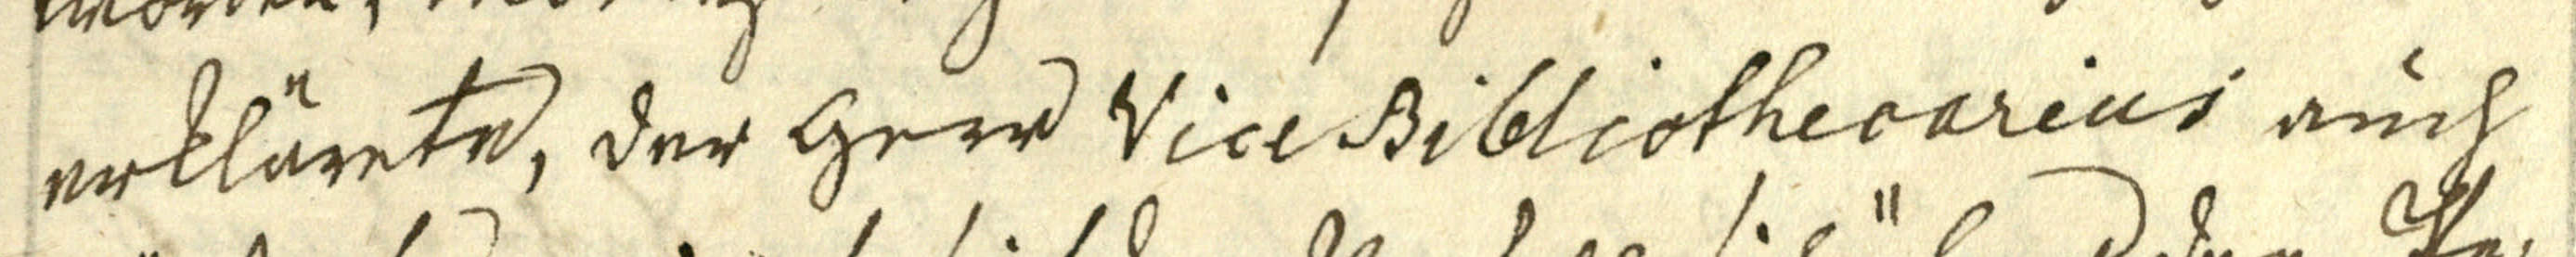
erklärete, der Herr Vice Bibliothecarius auch
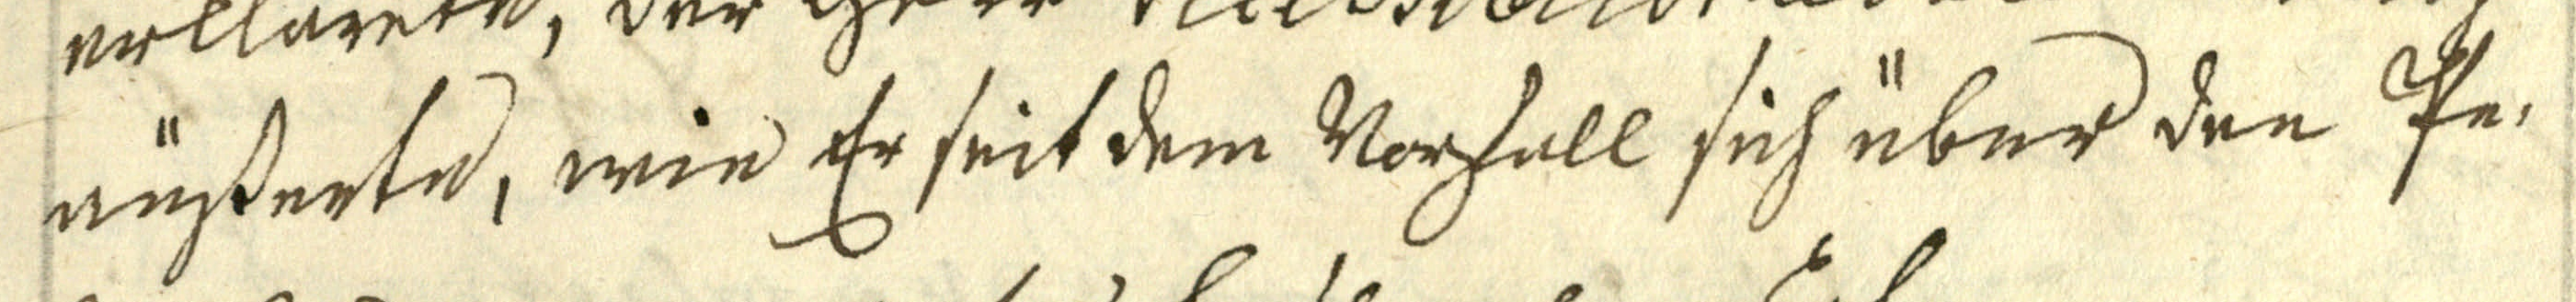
äußerte, wie Er seit dem Vorfall sich über den Pe¬
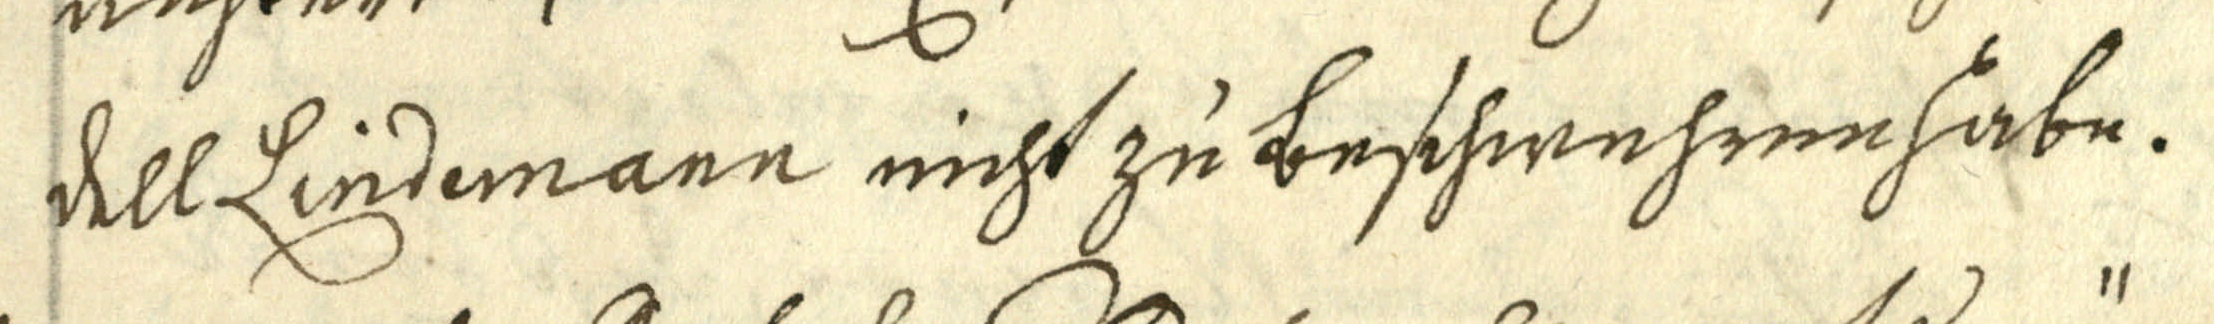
dell Lindemann nicht zu beschwehren habe.
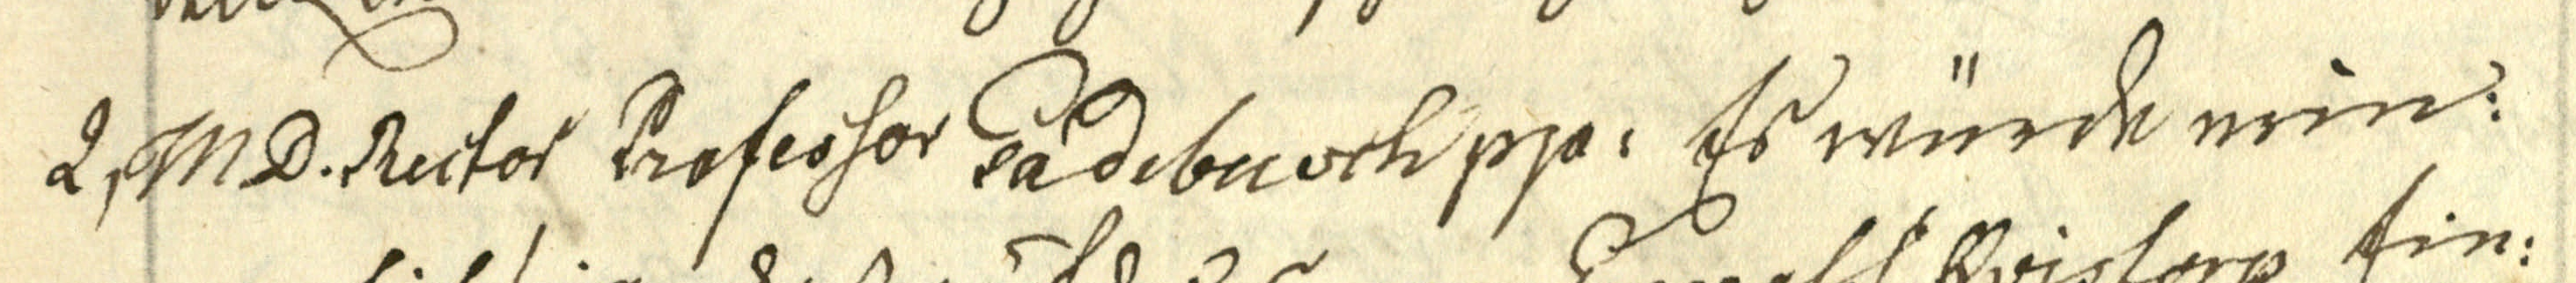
2, M. D. Rector Professor Gadebusch pp. Es würde erin¬
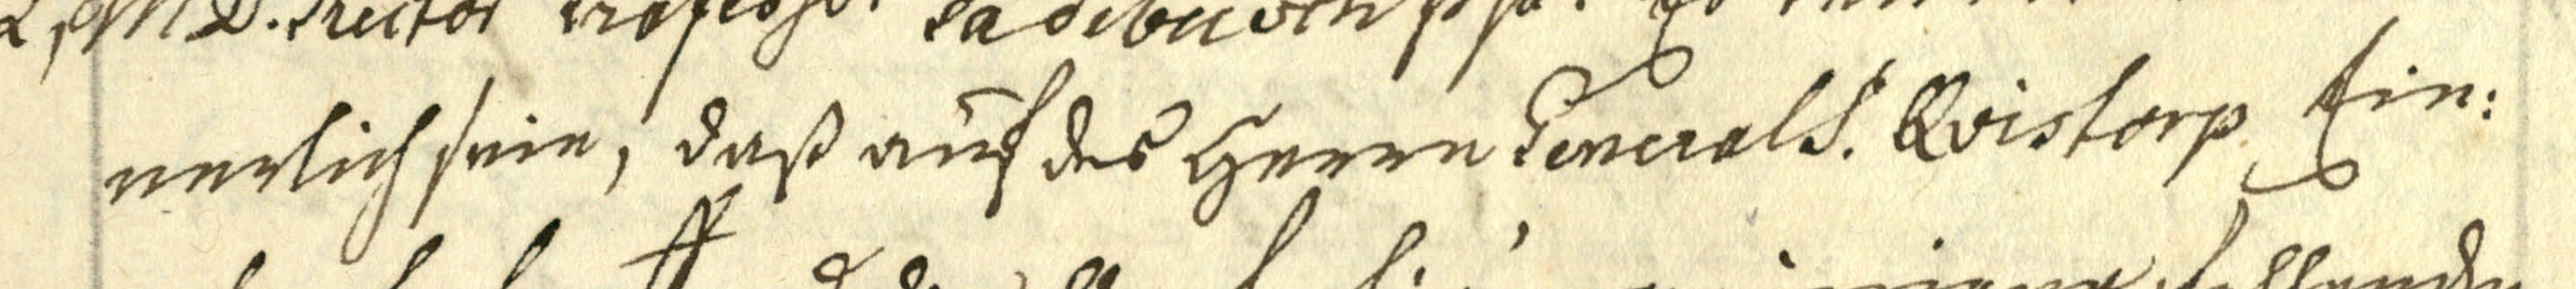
nerlich sein, daß auf des Herrn GeneralS. Quistorp Ein¬
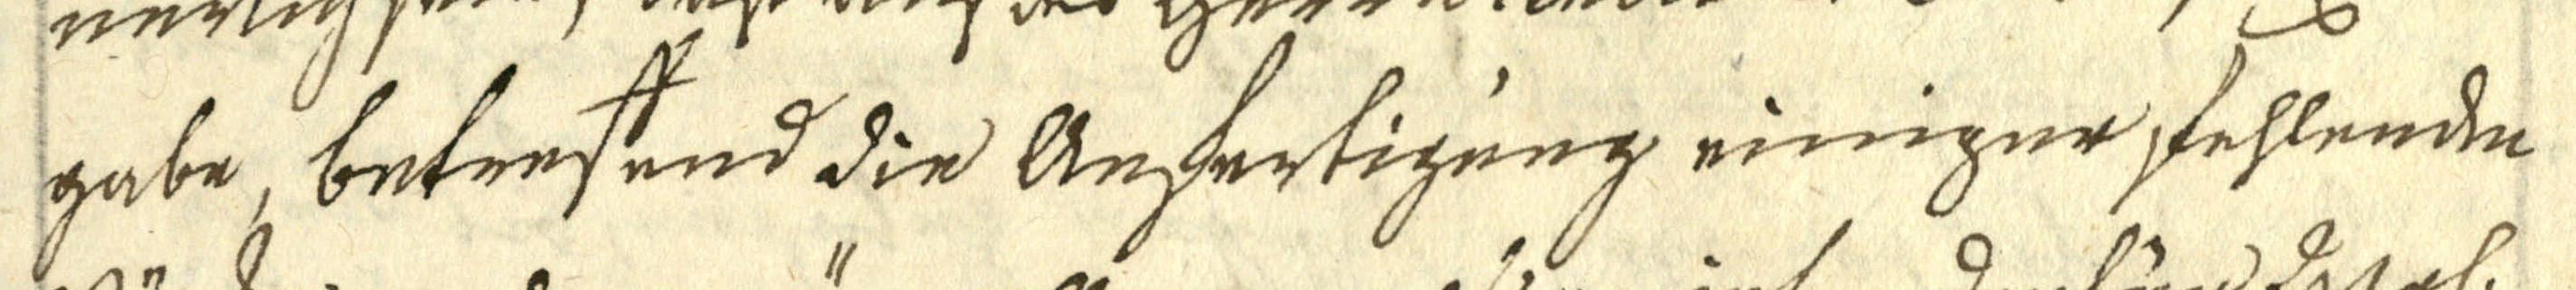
gabe betreffend die Anfertigung einiger fehlenden
